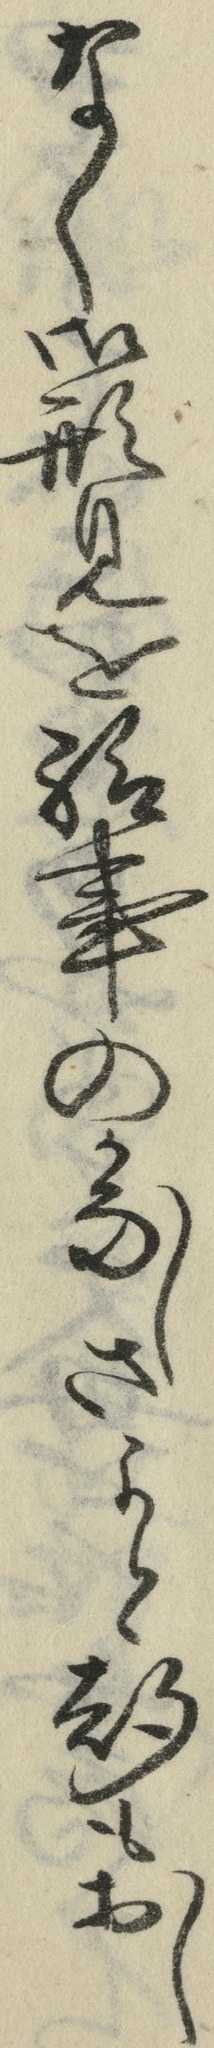なく御形見を給事のかなしさよと声もおし
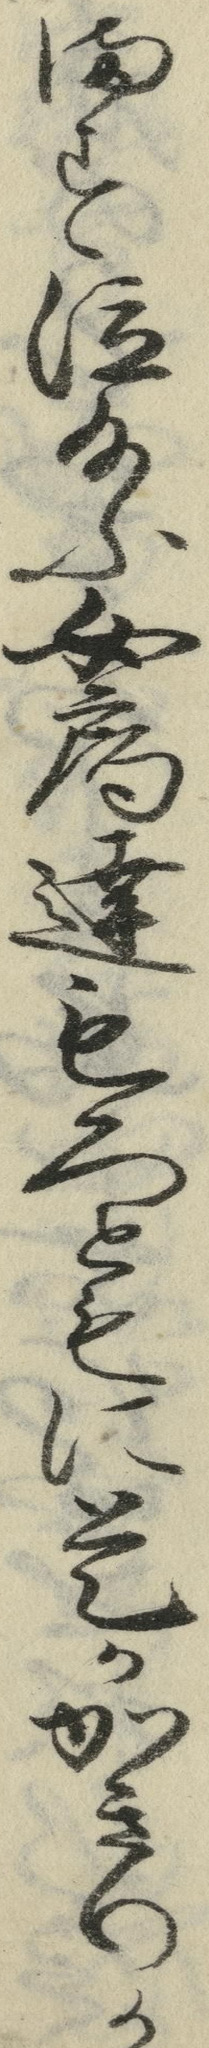ます泣給ふ女房達もろともに是かかきりか
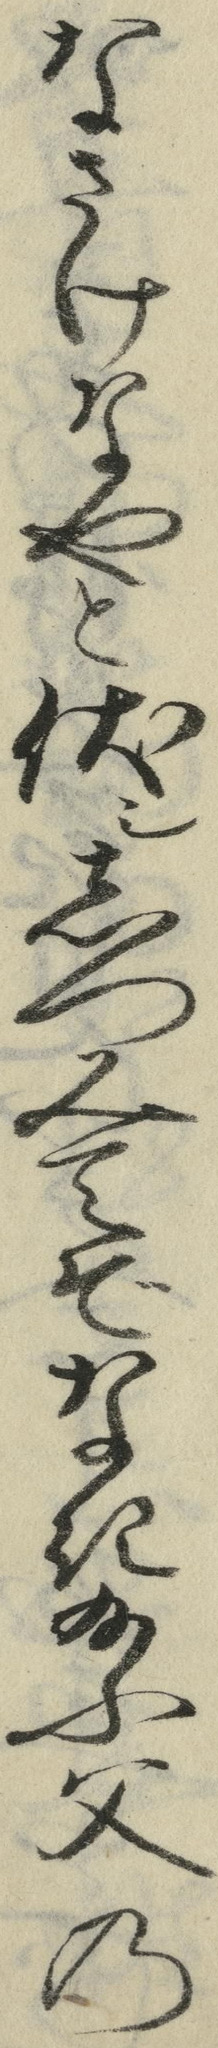なさけなやと伏シしつみてぞなき給ふ父の
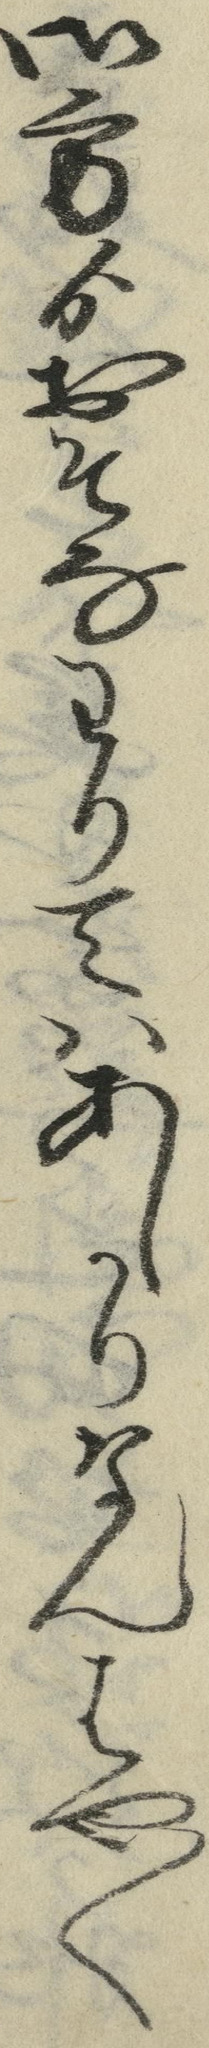御方ゟおそなわりてはあしかりなんはや〳〵
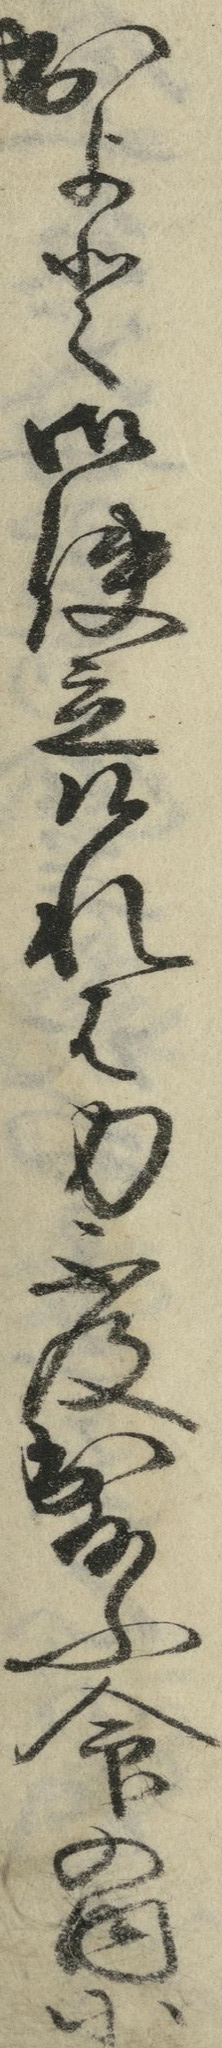出よと御使立けれは力不及出給ふ命の内に

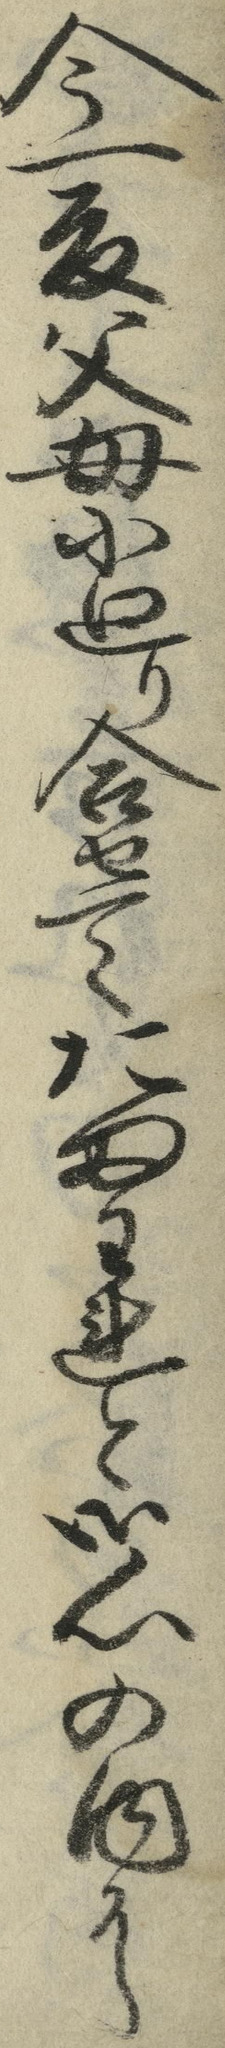今一度父母に廻合せてたまわれと御心の内に
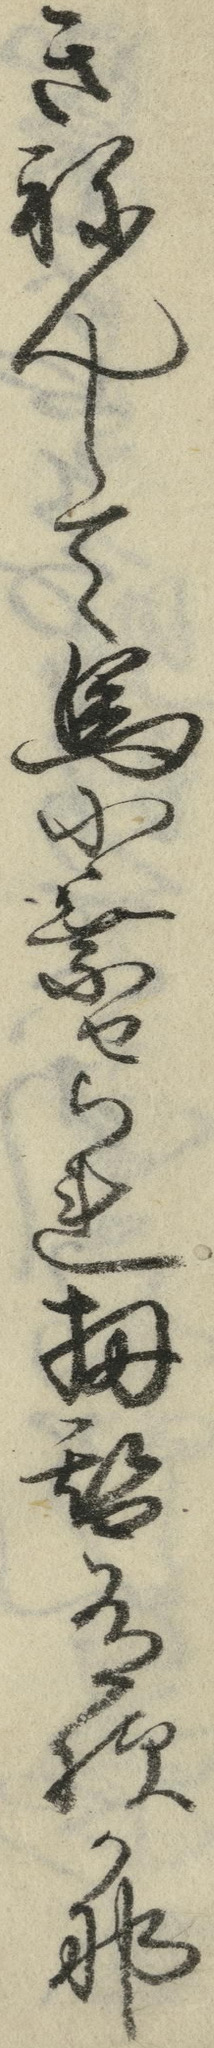きねんして馬に乗扨替有様かな
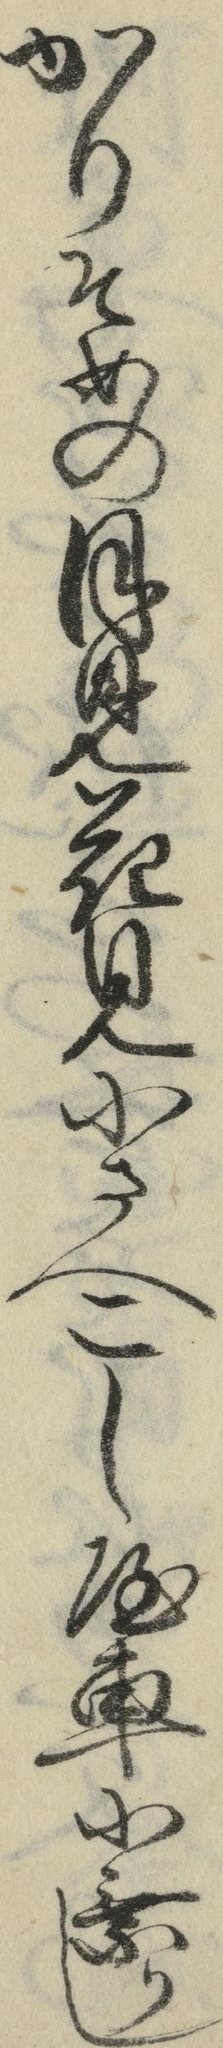かりそめの月見花見にさへこしや車に乗リし
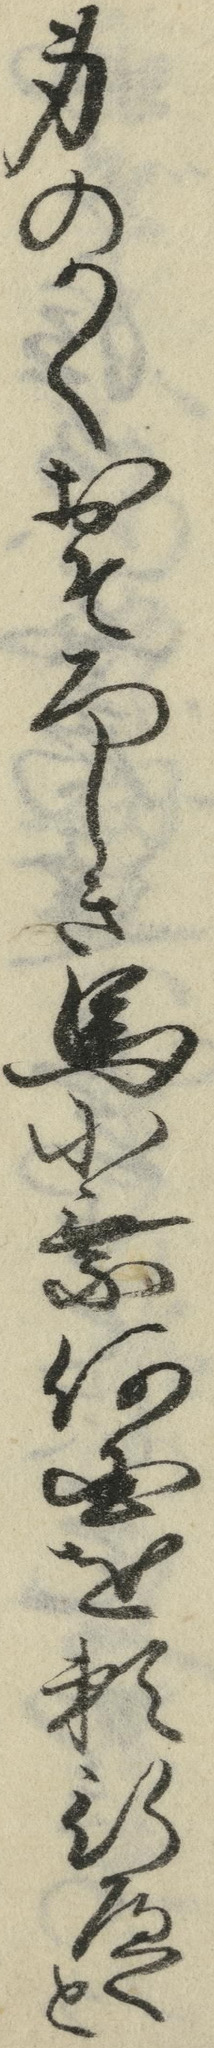身のかくおそろしき馬に乗何国を頼行へくと
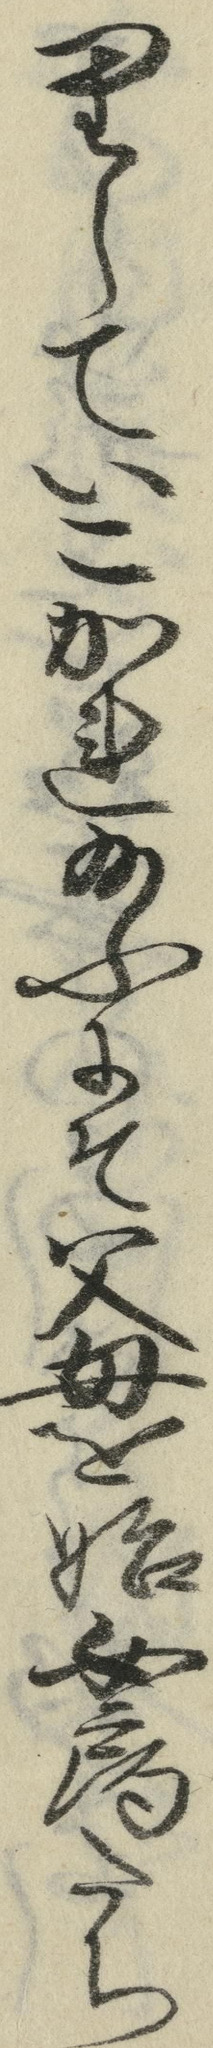りうていこかれ給ふにて父母を始女房たち
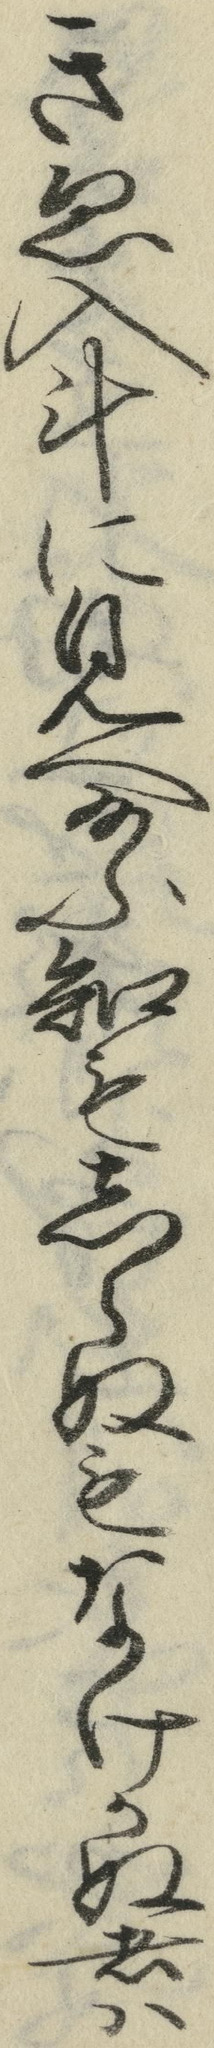きゑ入斗に見へ給ふ知もしらぬもなけかぬ者は
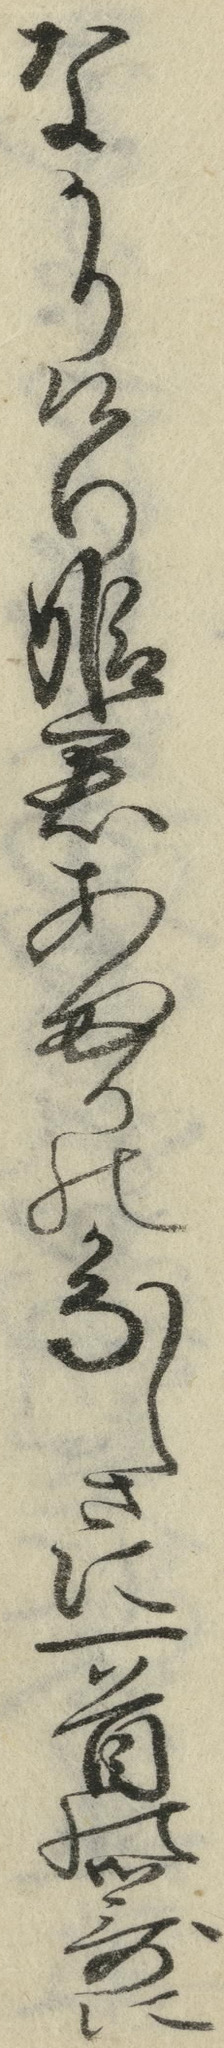なかりけり姫君あまりのかなしさに一首の御歌に
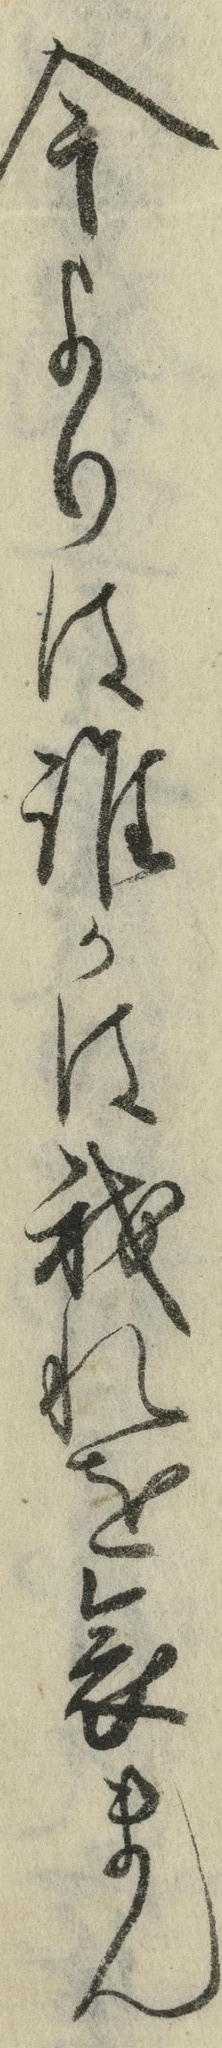今よりは誰かは我れを哀まん
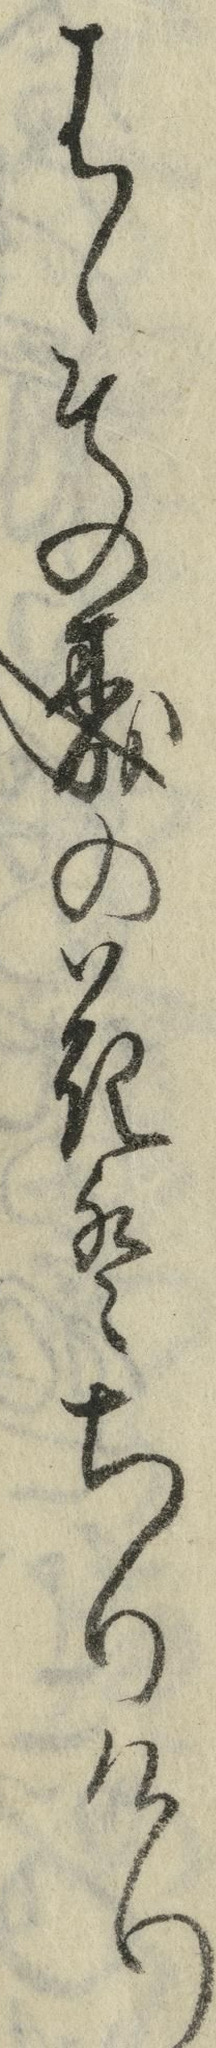はゝその森の花はちりけり
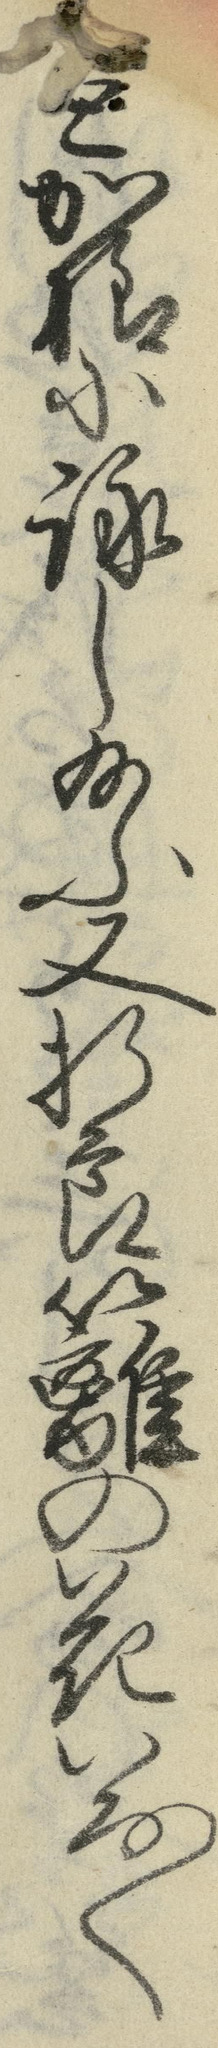とか様に詠し給ふ又折節籬の花いろ〳〵
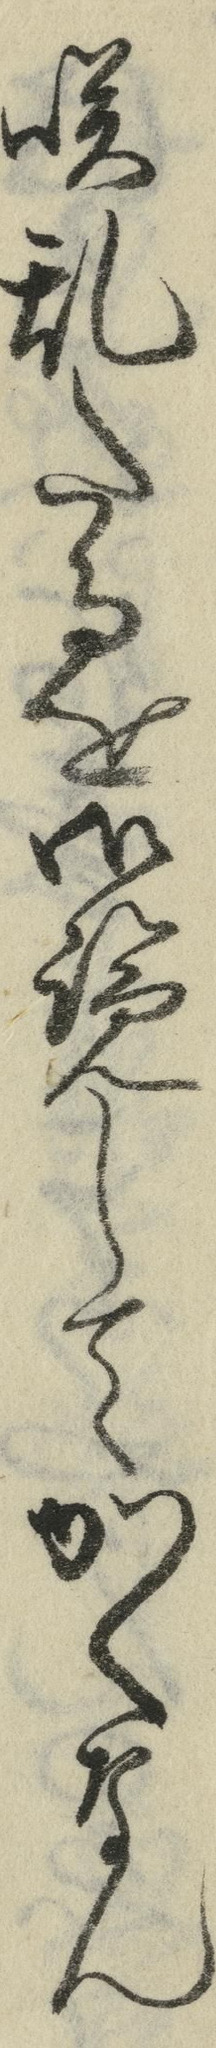咲乱たるを御覧してかくなん
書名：浅間記
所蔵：東京大学地震研究所図書室 Earthquake Research Institute Library, The University of Tokyo, JAPAN
